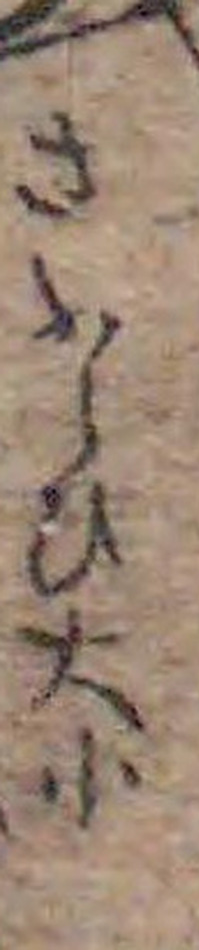さふらひ大小
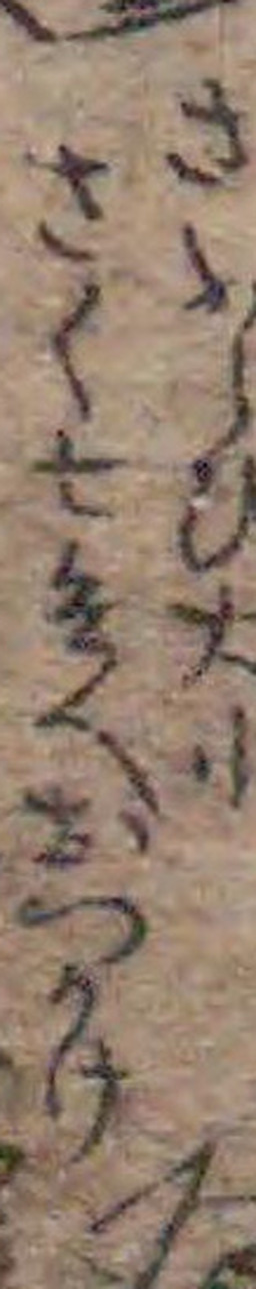さく七兵衛おつかけ
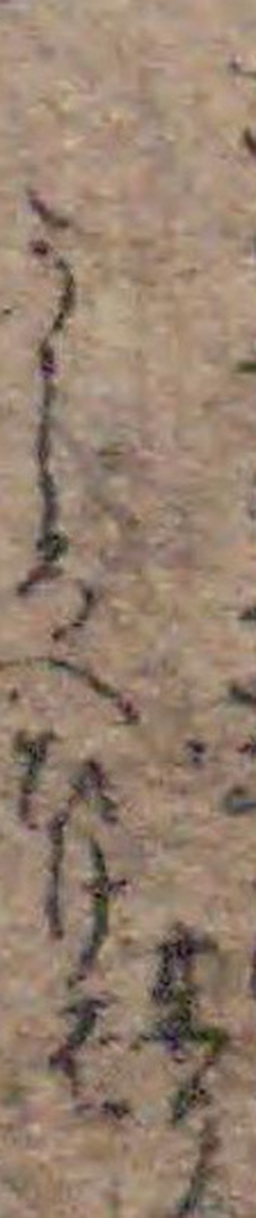うしろへひけば
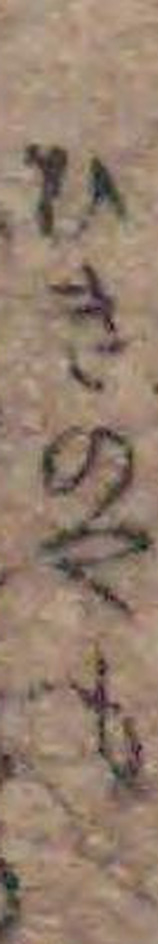ひきのやも
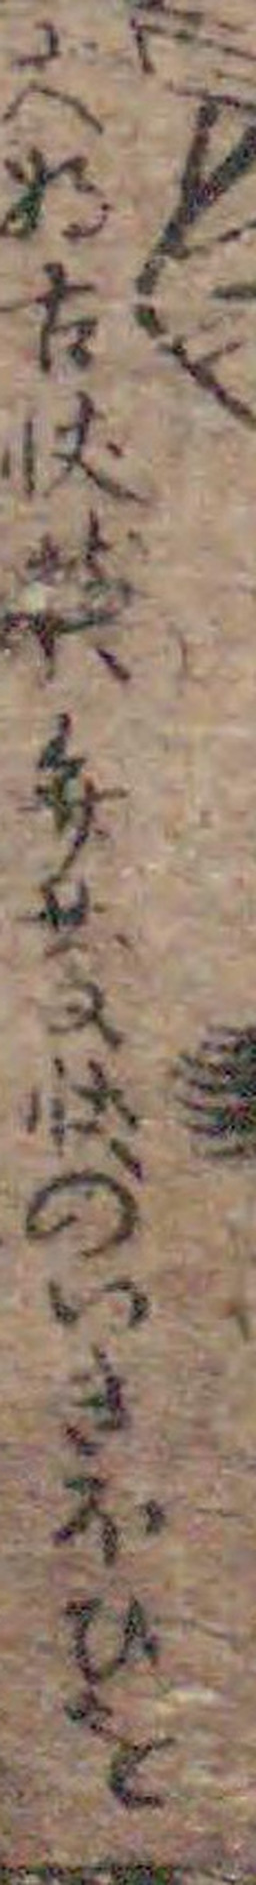大将古状は弁慶状のいきほひを
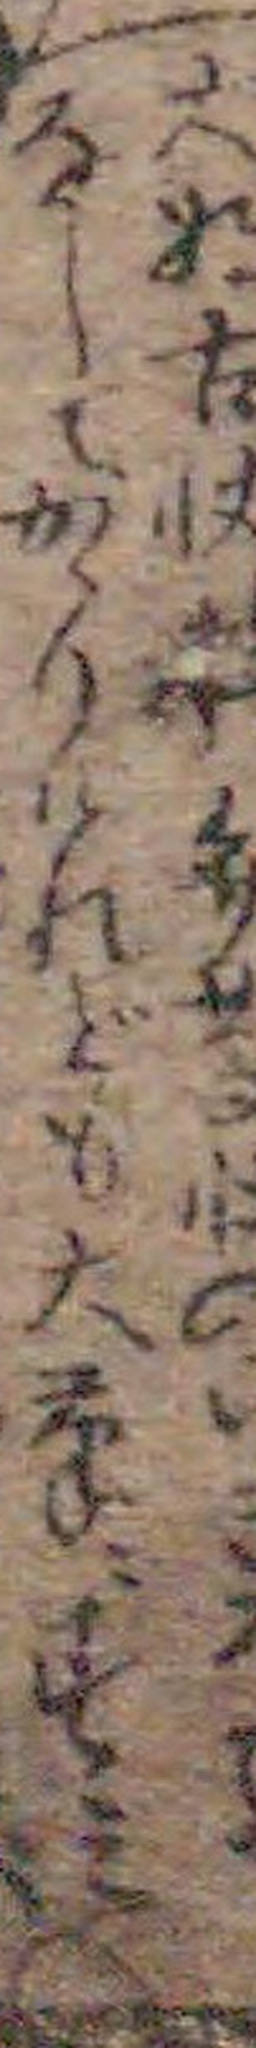なしてかゝりけれども大筆にすみ
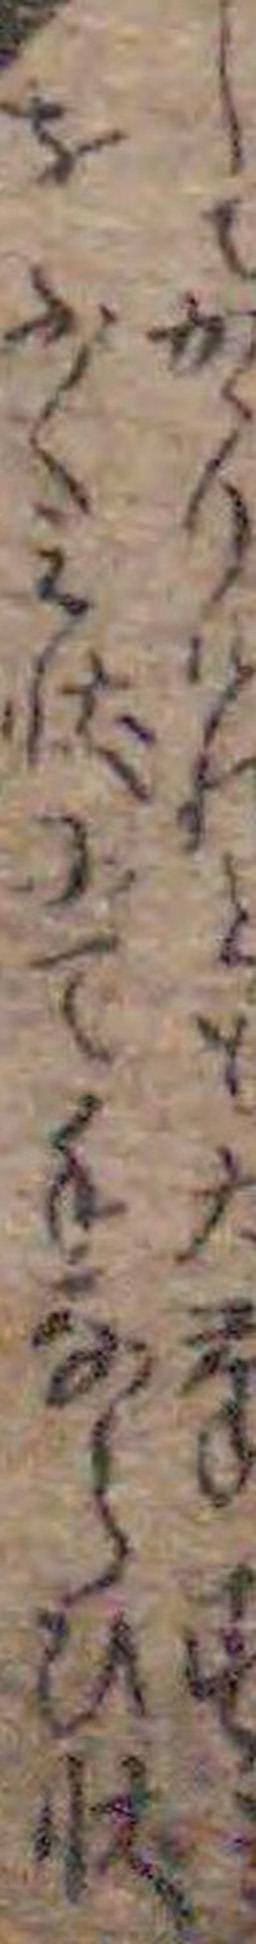をふくみ状にて手ならひ状
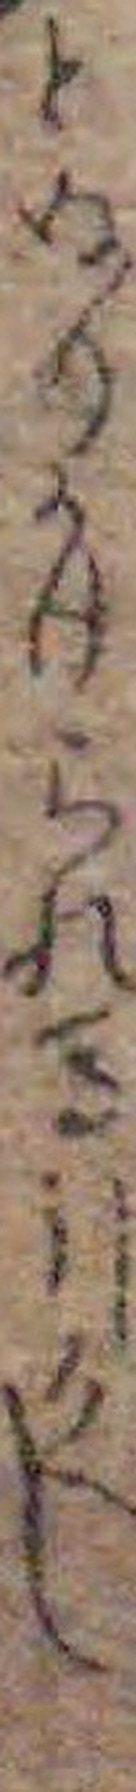とぬりかけられて引かへし
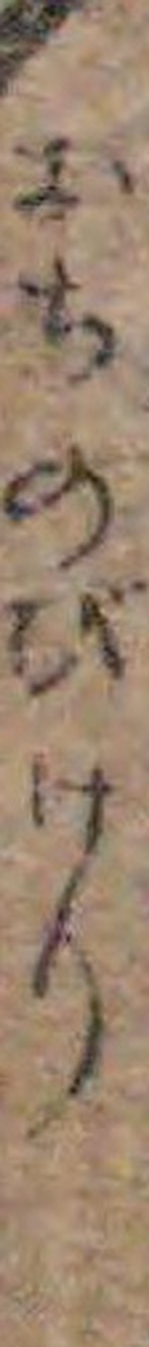おちのびけり

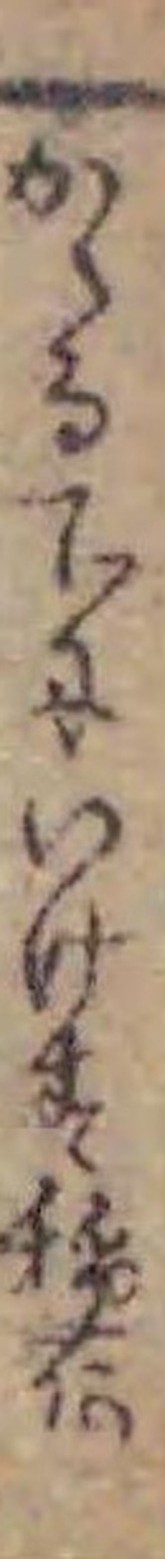かゝる下にいけす稲荷
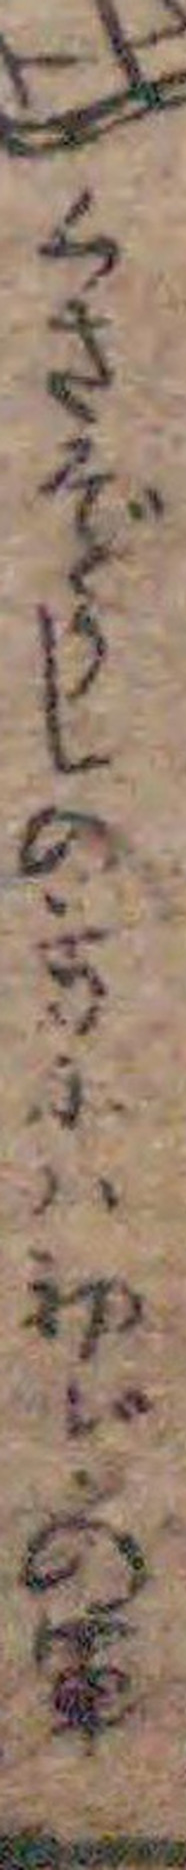くさぞうしの方は初どの軍
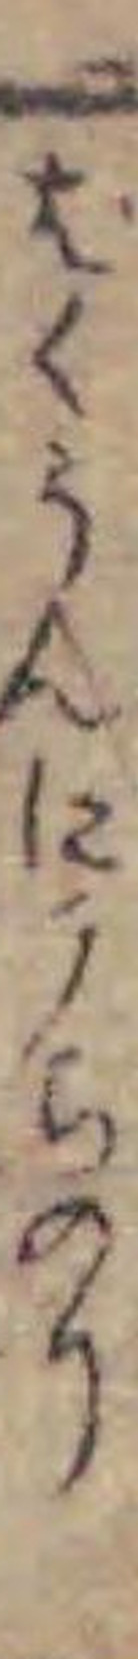はくうんにうちのり
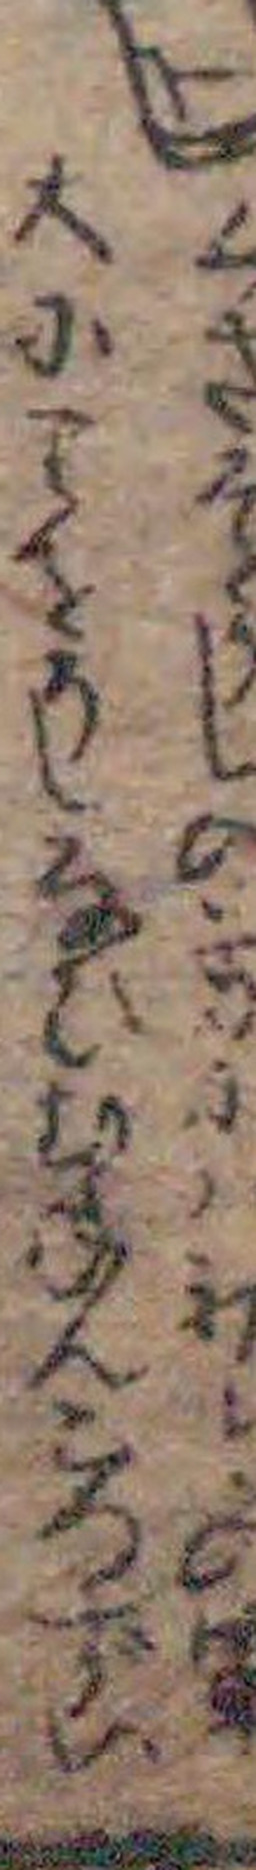大にてをうしなひむねんこつづい
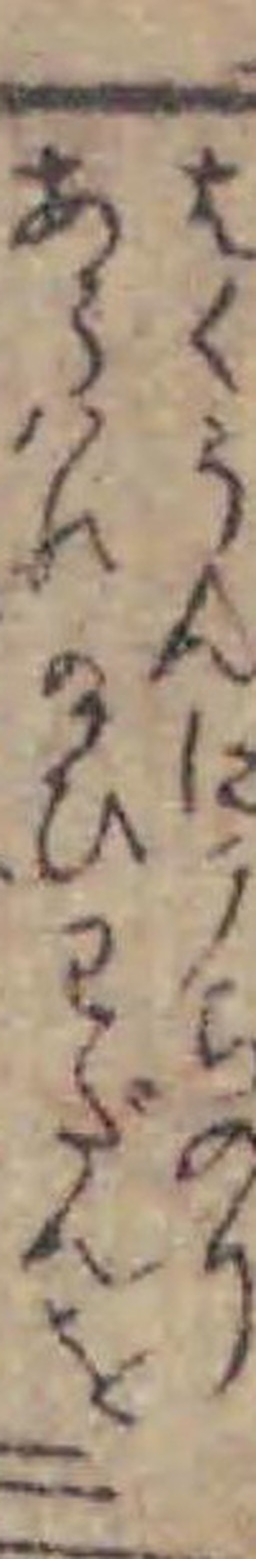あらはれ給ひわだんを
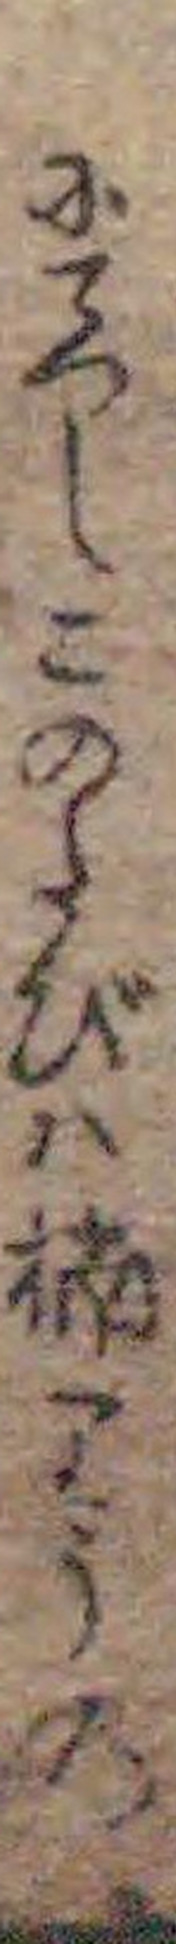にてつしこのたびは楠こうの
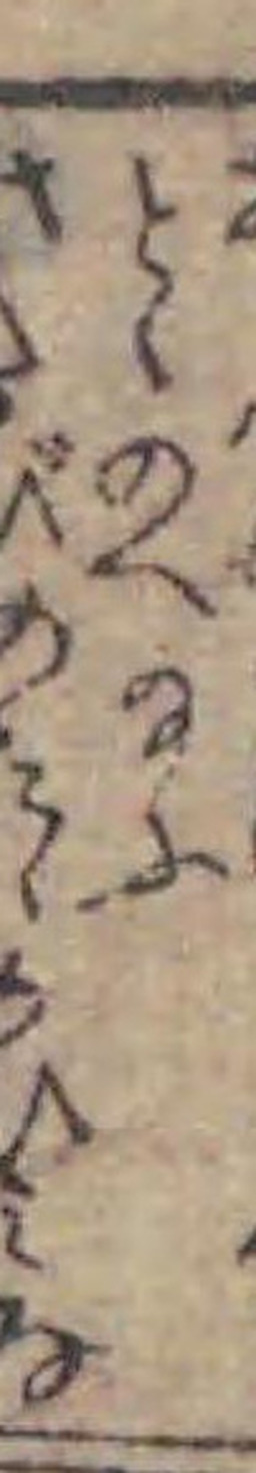此たびのたゝかひみな
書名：三舛増鱗組 : 3巻
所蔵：国立国会図書館 National Diet Library, JAPAN
